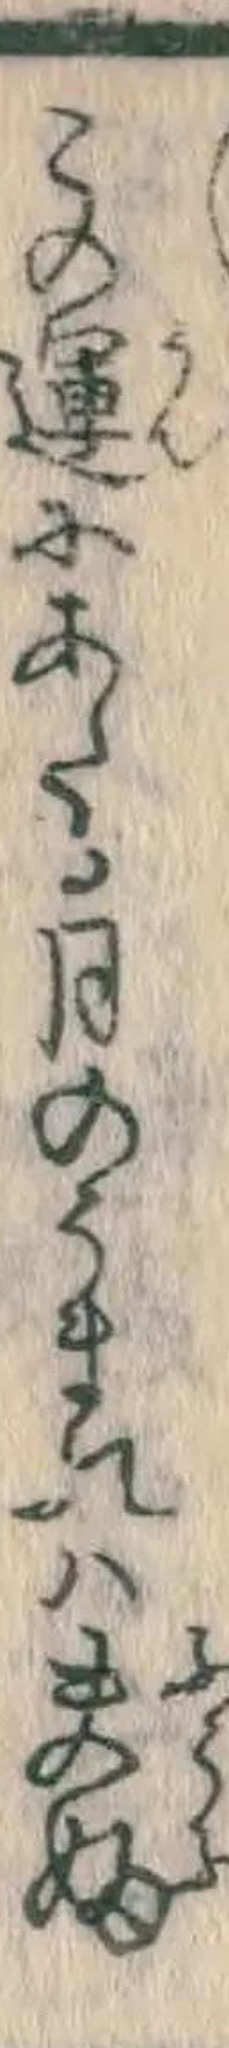この運にあたる月のうまれは夫婦
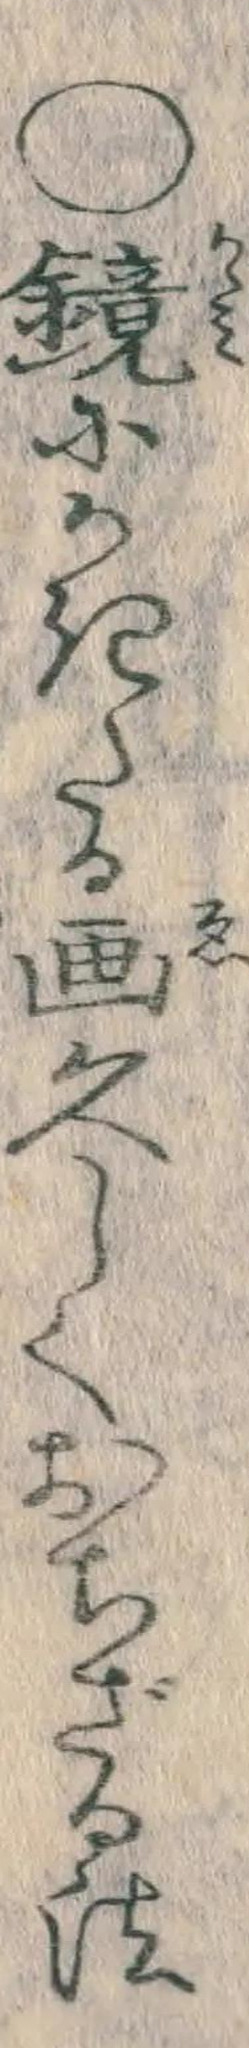○鏡にかきたる画久しくおちざる法
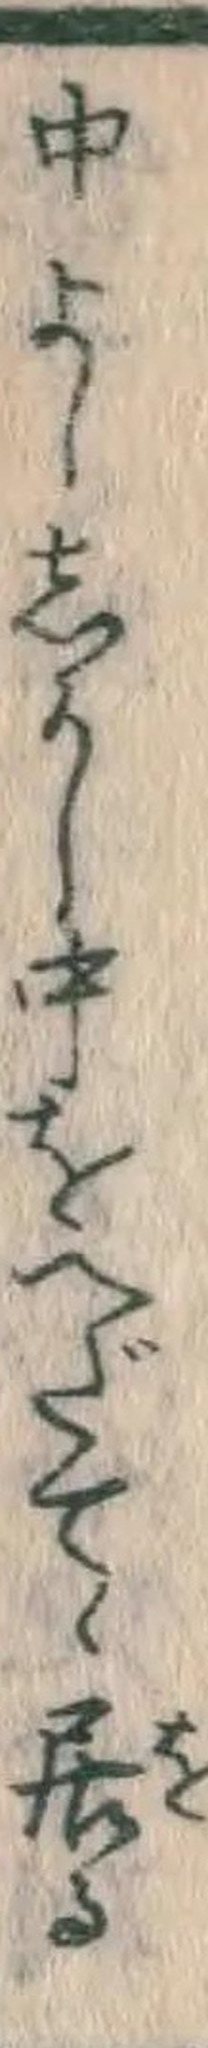中よししかし中をへだてゝ居る
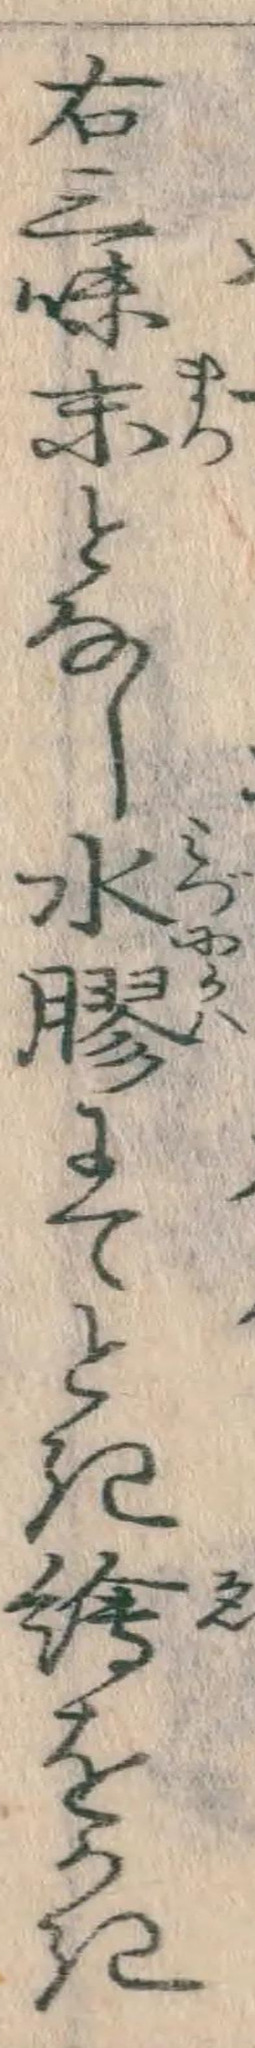右三味末となし水膠にてとき絵をかき
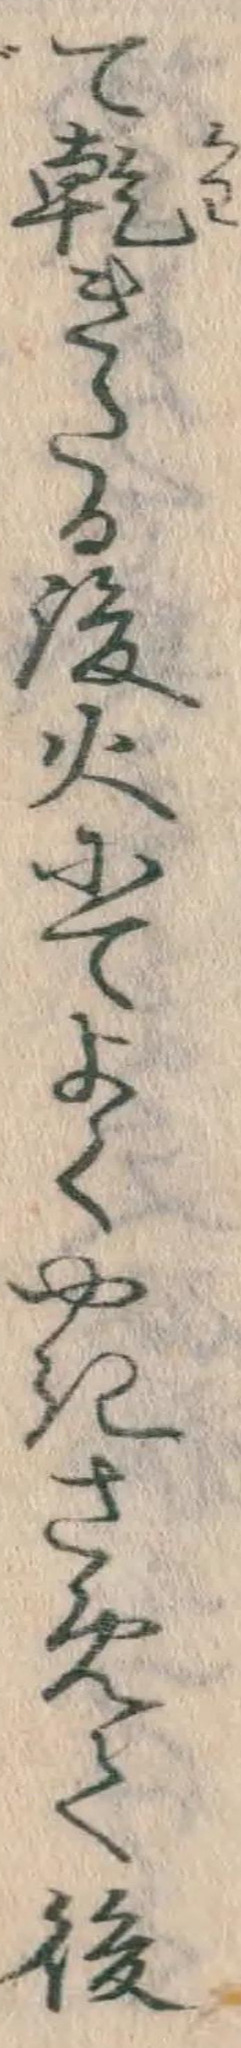て乾きたる後火にてよくやきさめて後
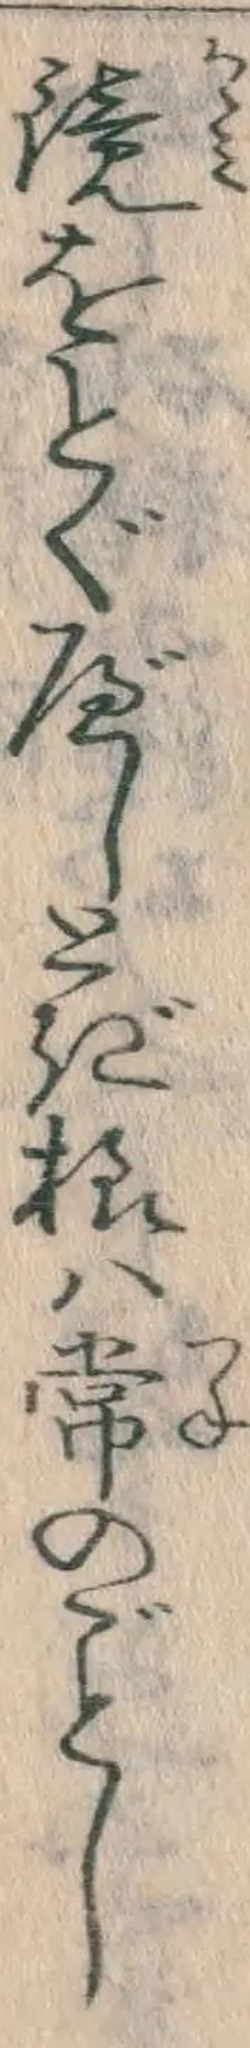鏡をとぐべしとぎ様は常のごとし
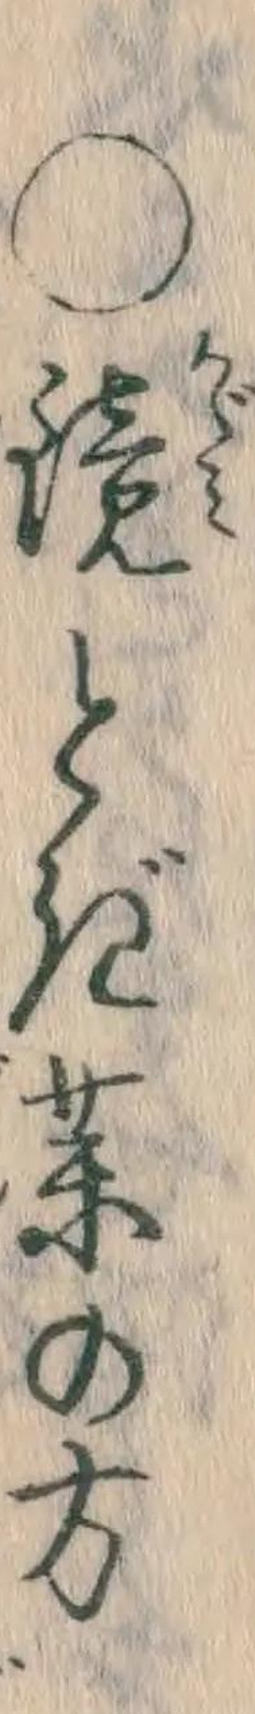○鏡とぎ薬の方
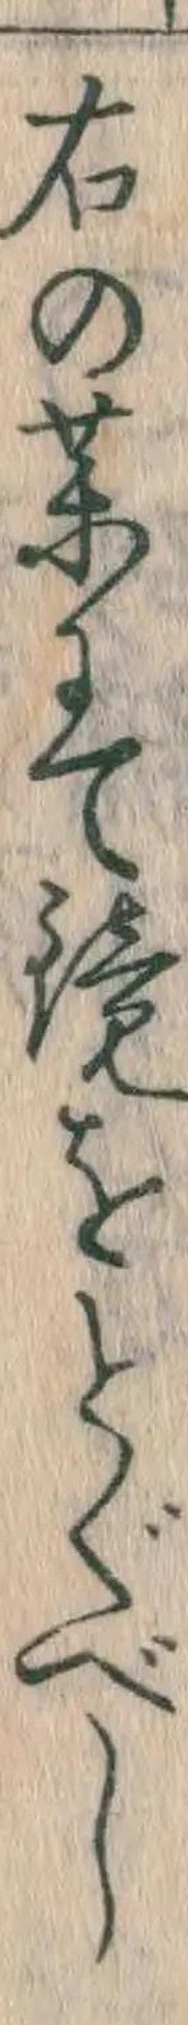右の薬にて鏡をとぐべし
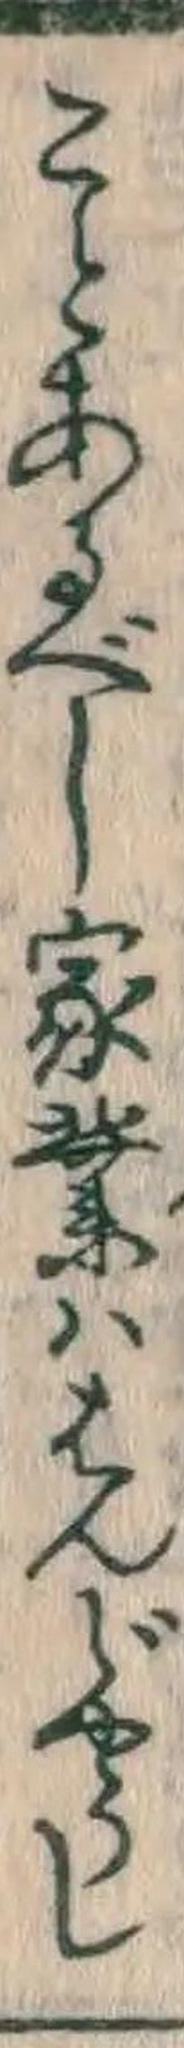ことあるべし家業ははんじやうし
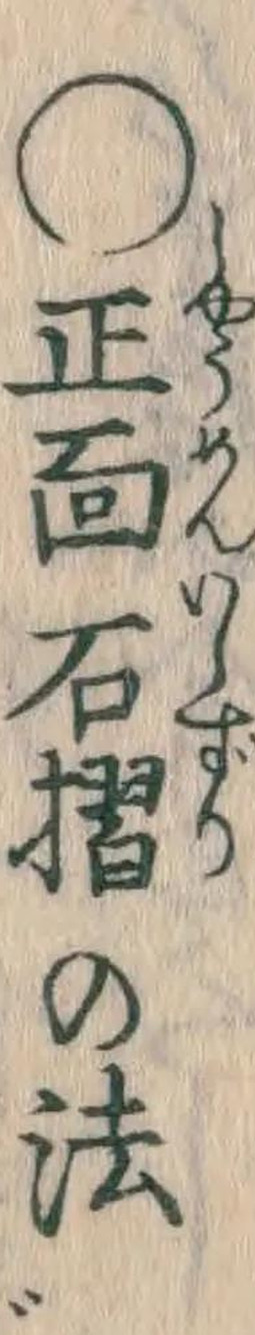○正面石摺の法
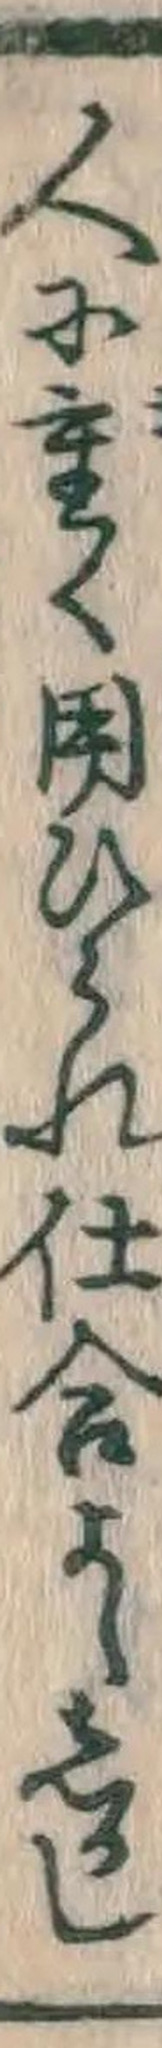人に重く用ひられ仕合よししかし
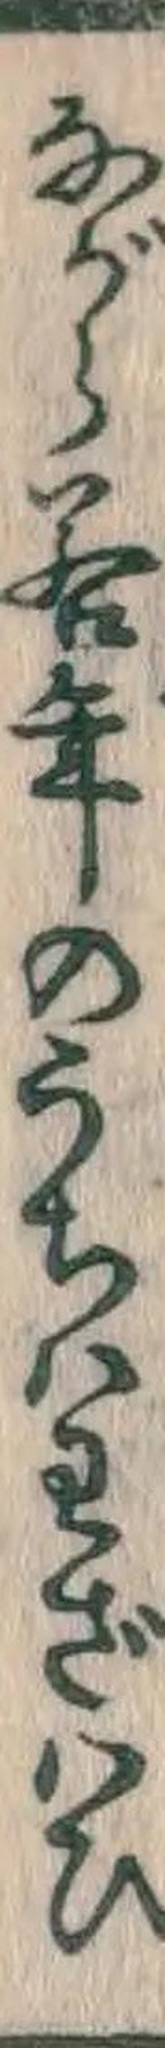ながら若年のうちはわざはひ
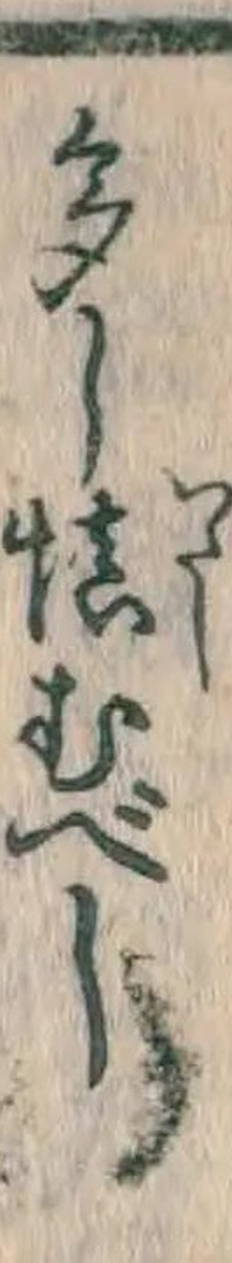多し慎むべし
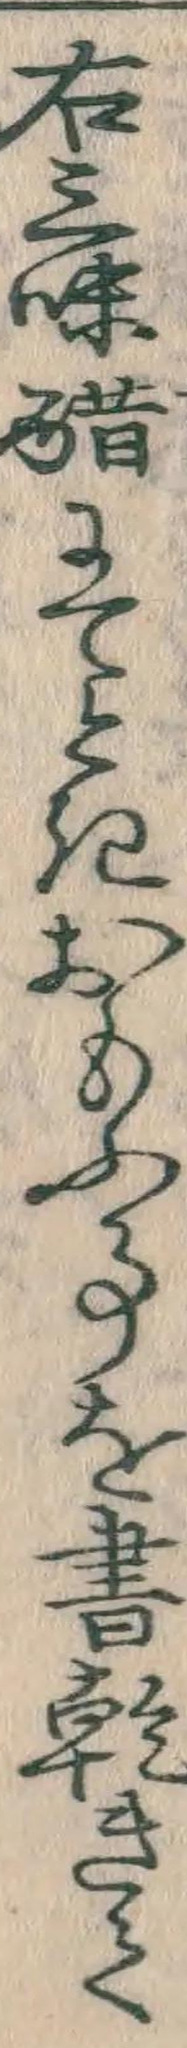右三味醋にてときおもふ事を書乾きて
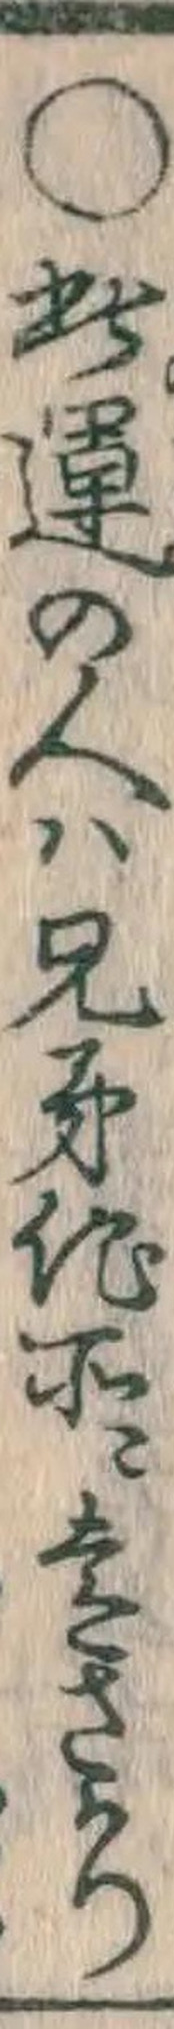○此運の人は兄弟他所に遠さかり
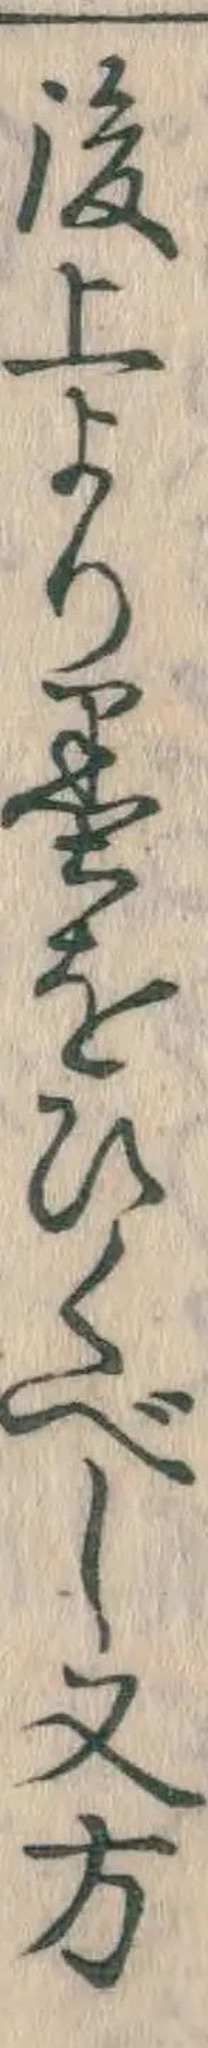後上より墨をひくべし又方
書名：広益秘事大全 3巻. [2]
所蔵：国立国会図書館 National Diet Library, JAPAN
